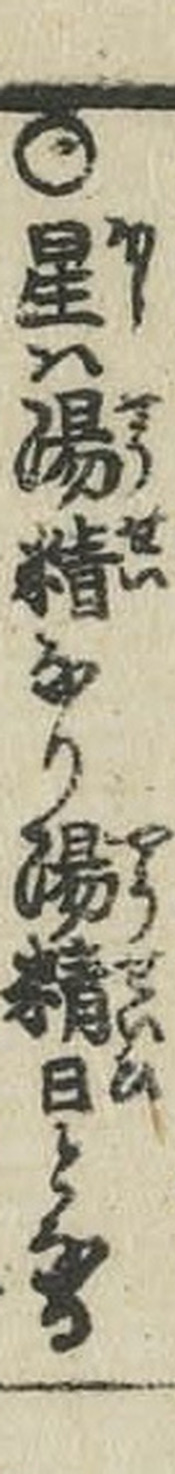○星は陽精なり陽精日となる
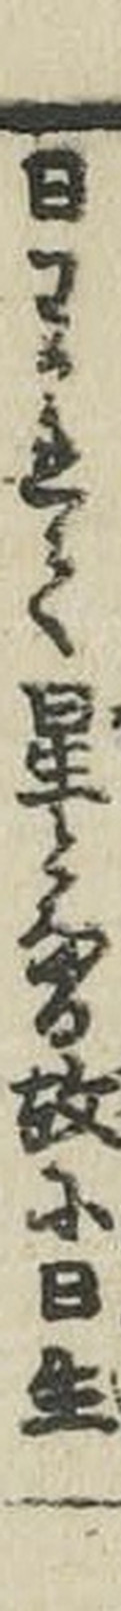日わかれて星となる故に日生
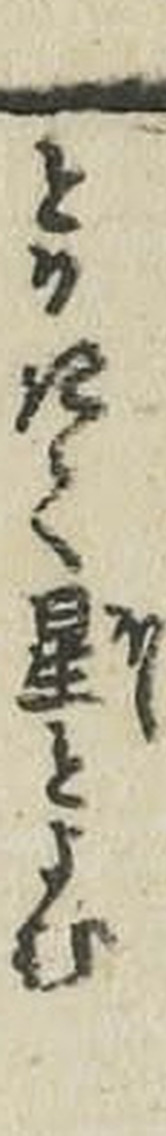とかきて星とよむ
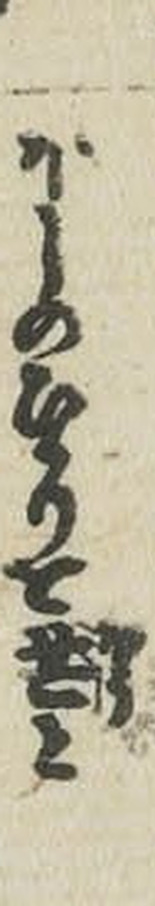ほしのひかりを芒と
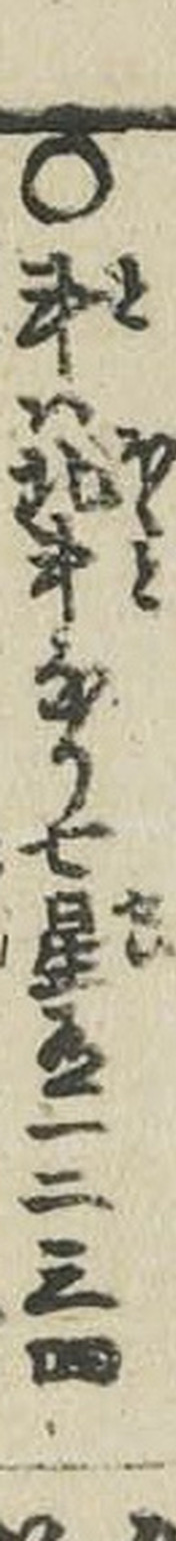○斗は北斗なり七星有一二三四
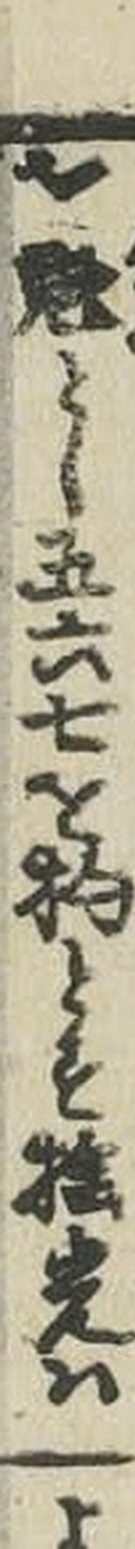を魁とし五六七を杓とす揺光は
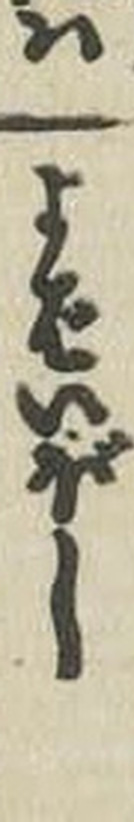よばいぼし
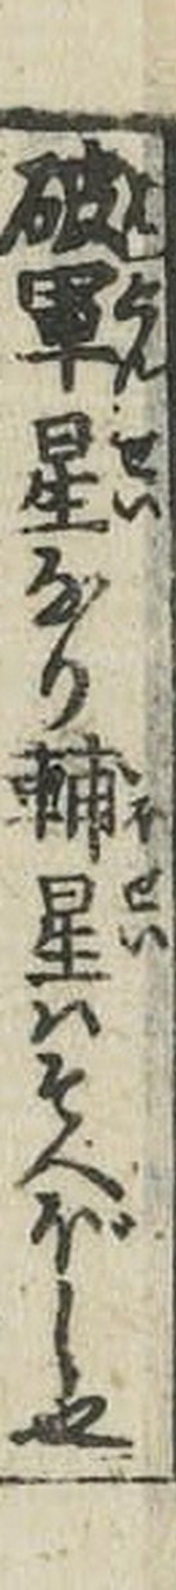破軍星なり輔星はそへぼし也
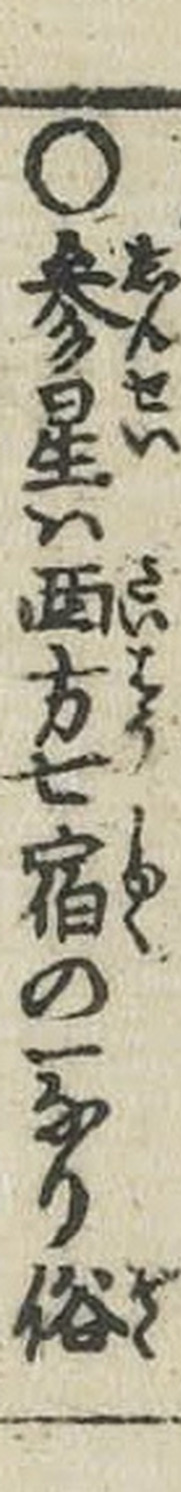○参星は西方七宿の一なり俗
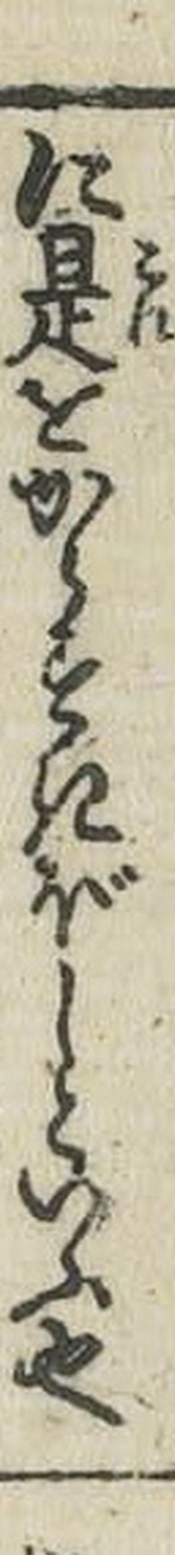に是をからすきぼしといふ也
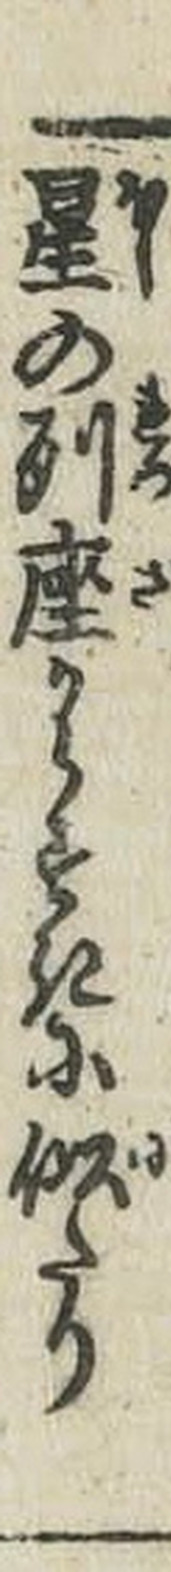星の列座からすきに似たり
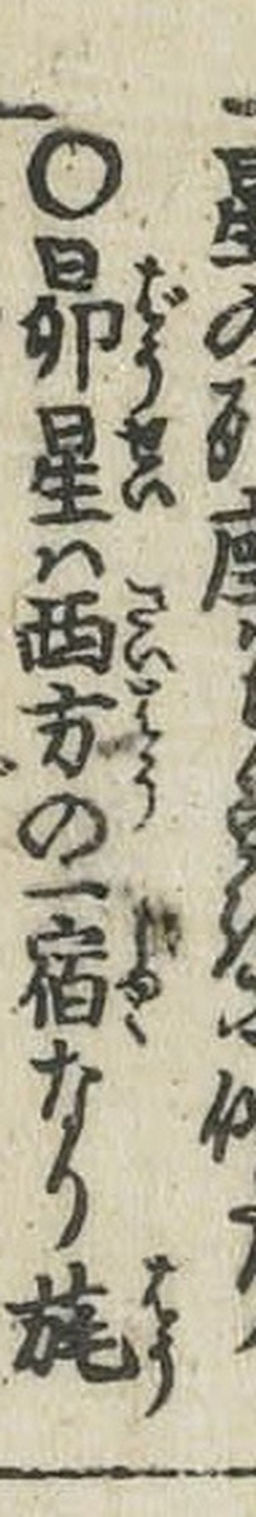○昴星は西方の一宿なり旄
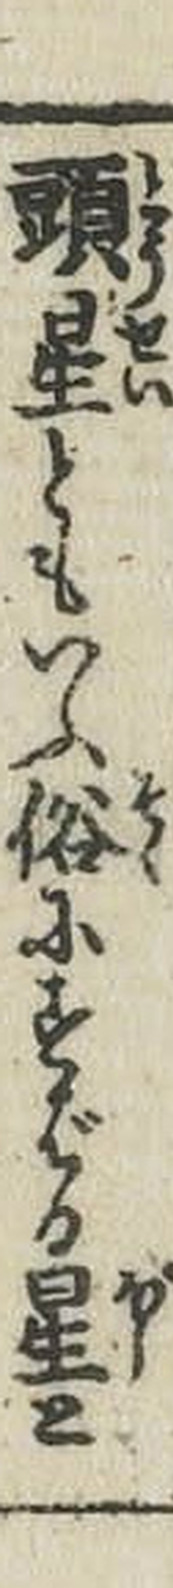頭星ともいふ俗にすばる星と
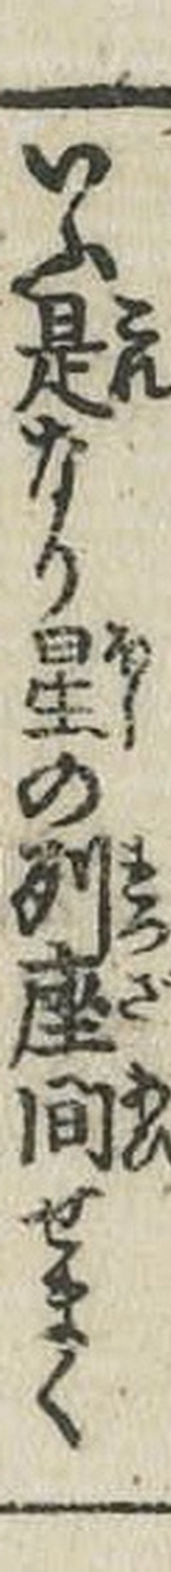いふ是なり星の列座間せまく
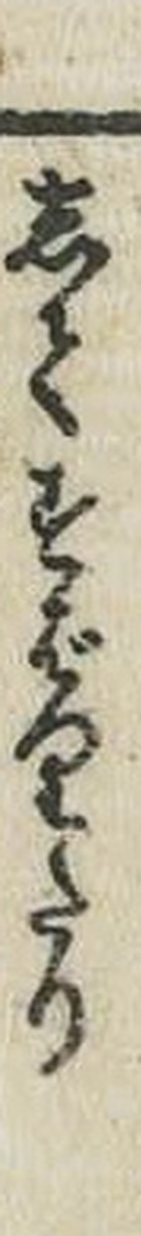してすばりたり
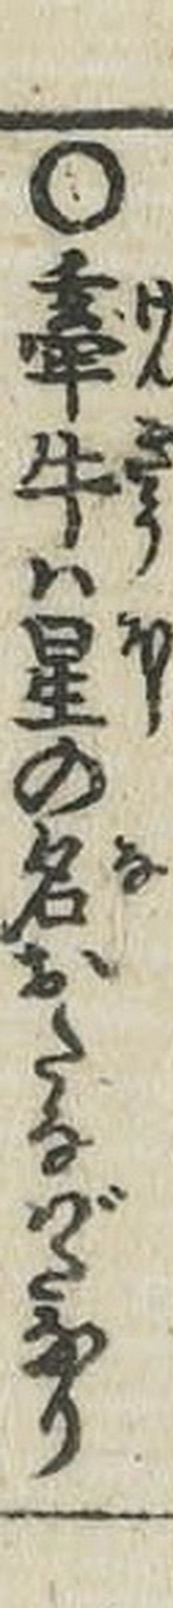○牽牛は星の名おたなばたなり
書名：増補頭書訓蒙図彙大成 10巻 2:巻之1-3
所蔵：東京学芸大学教育コンテンツアーカイブ
